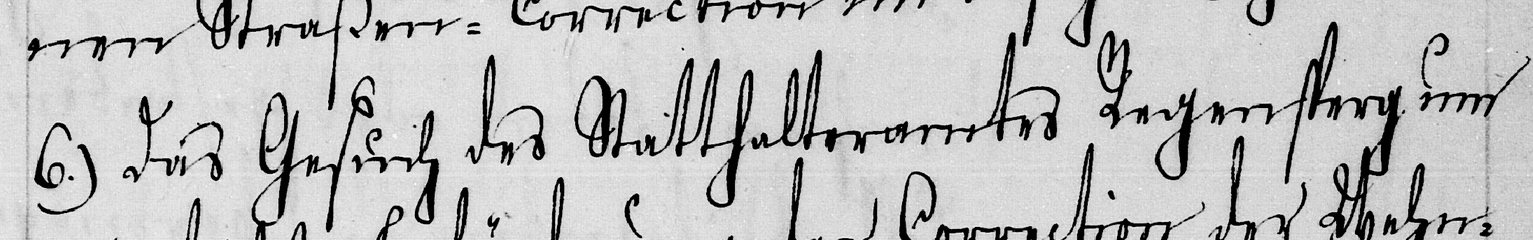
6.) Das Gesuch des Statthalteramtes Regensperg um
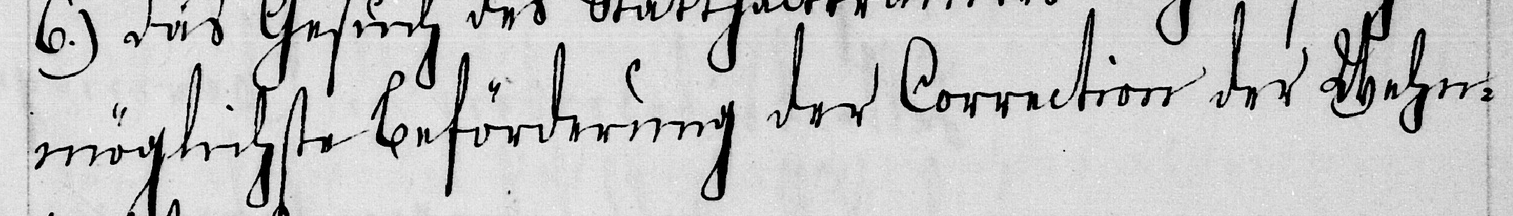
möglichste Beförderung der Correction der Wehn¬
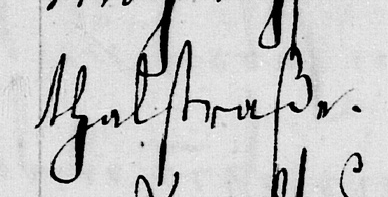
thalstraße.
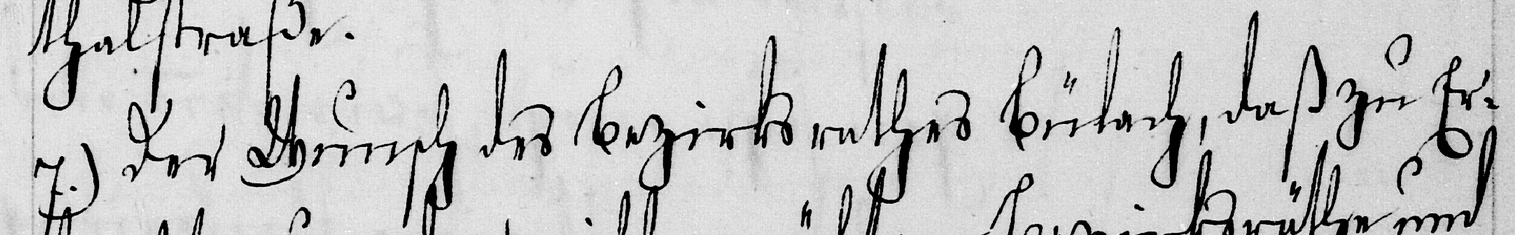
7.) Der Wunsch des Bezirksrathes Bülach, daß zu Er¬
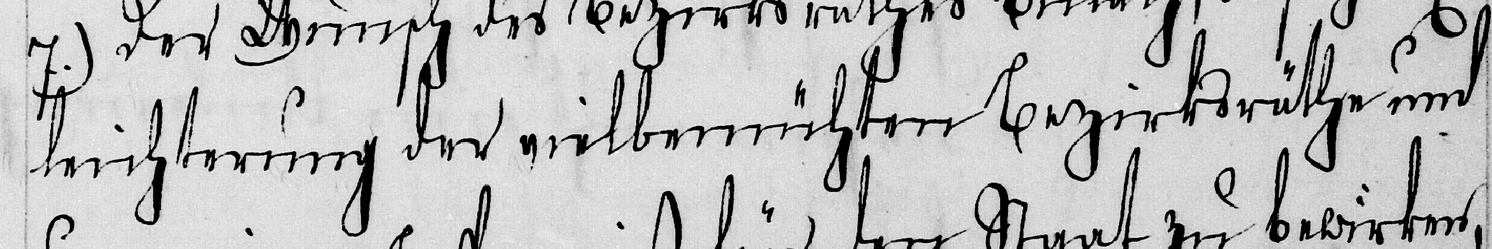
leichterung der vielbemühten Bezirksräthe und
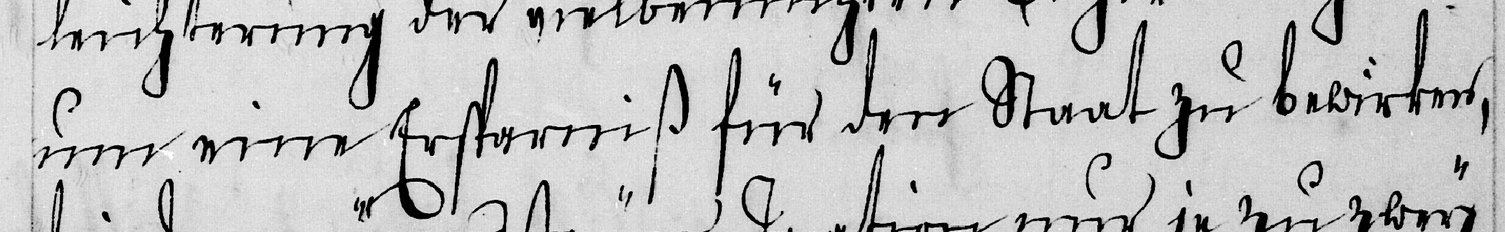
um eine Ersparniß für den Staat zu bewirken,
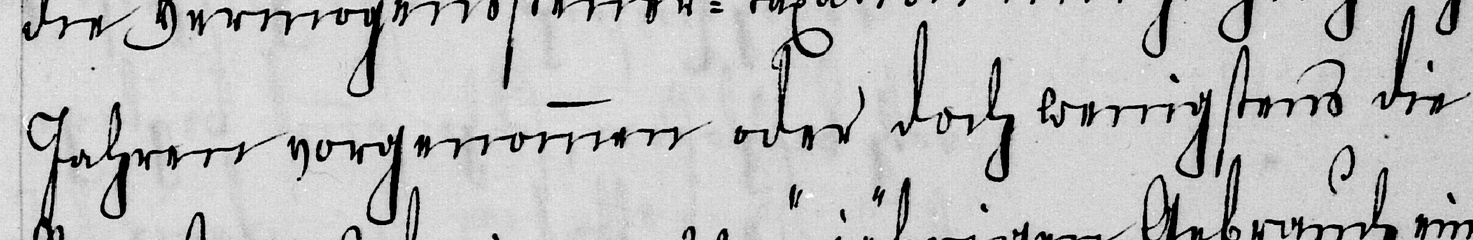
Jahren vorgenommen oder doch wenigstens die
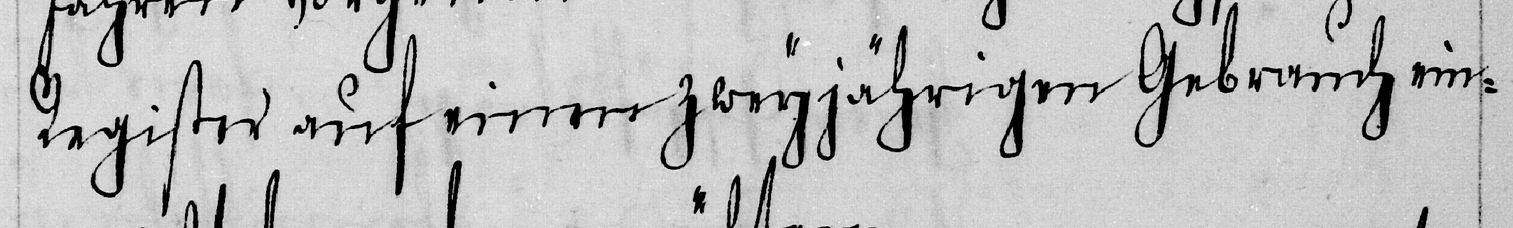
Register auf einen zweyjährigen Gebrauch ein¬
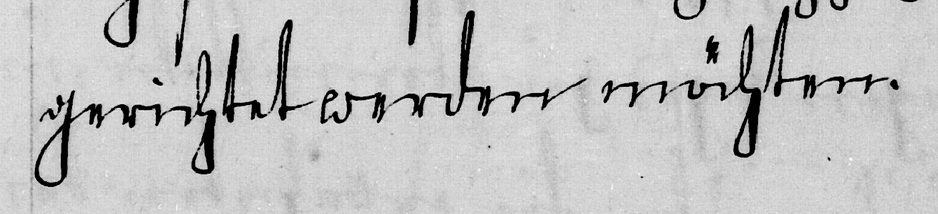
gerichtet werden möchten.
